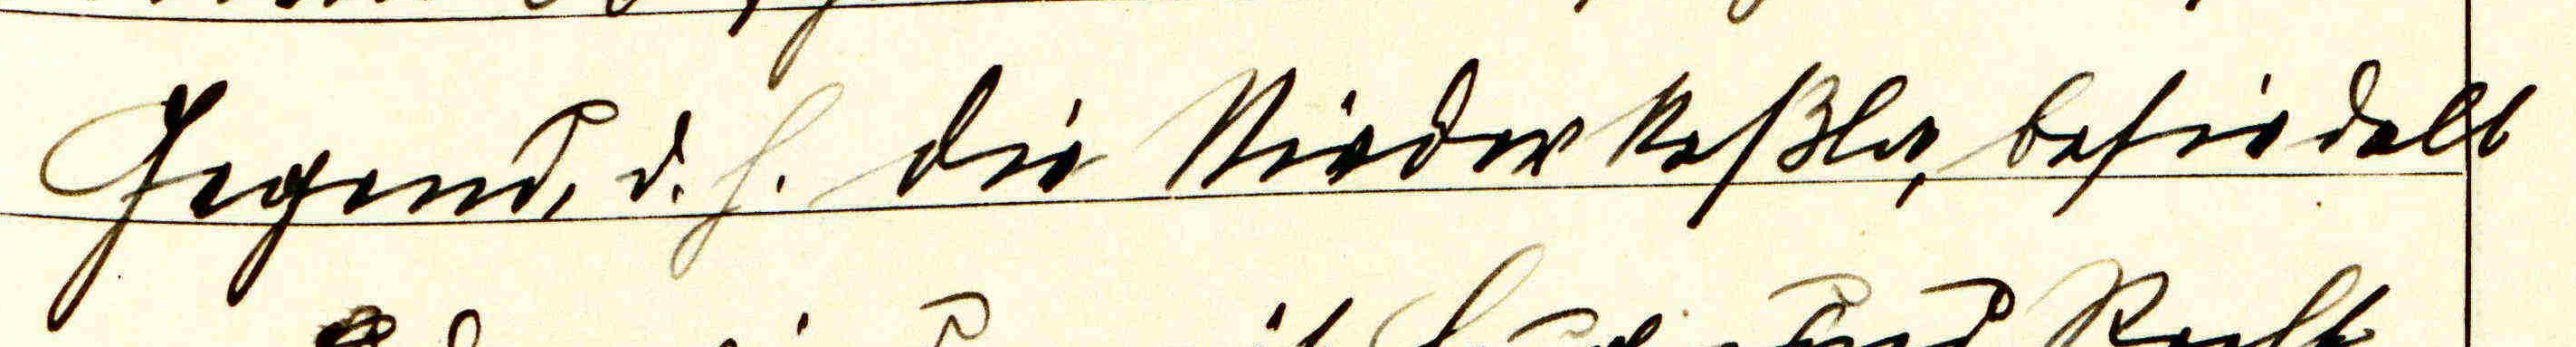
Gegend d.h. die Niederkeßla, besiedelt
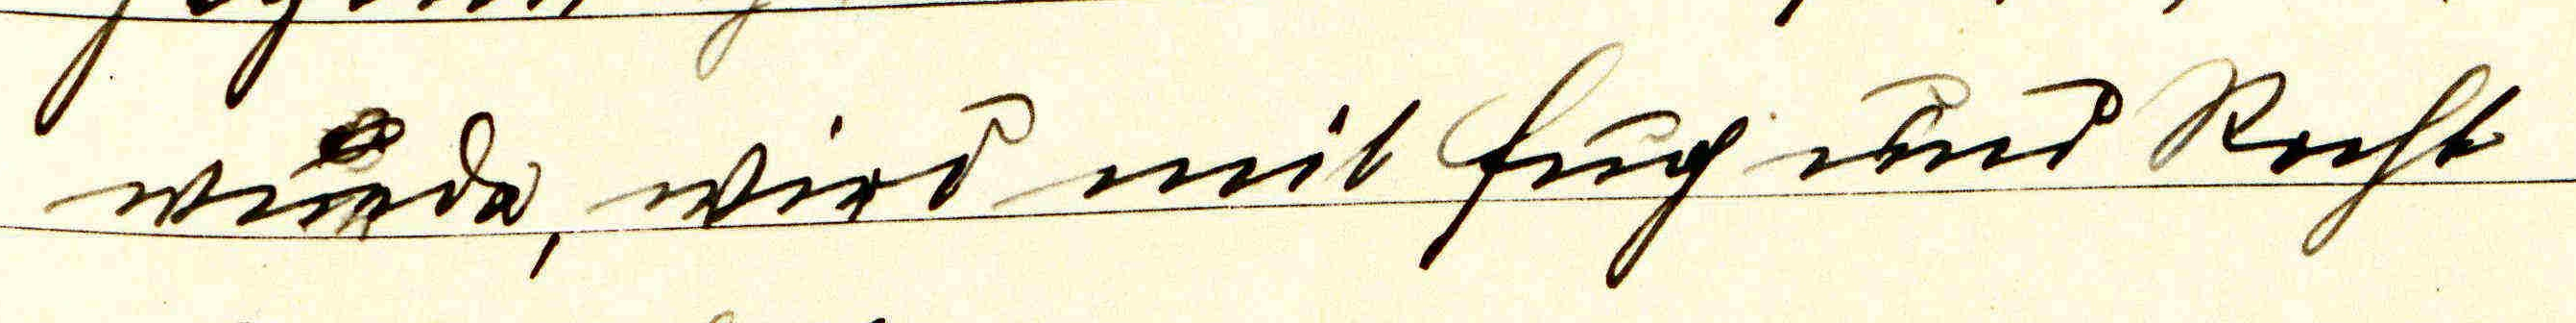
wurde, wird mit Fug und Recht
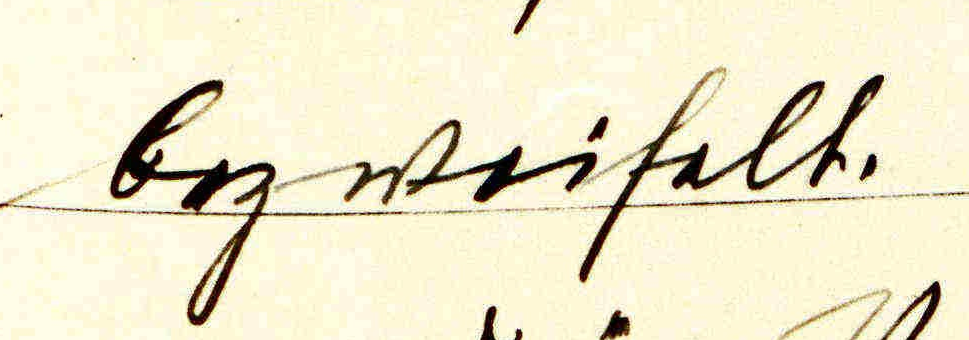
bezweifelt.
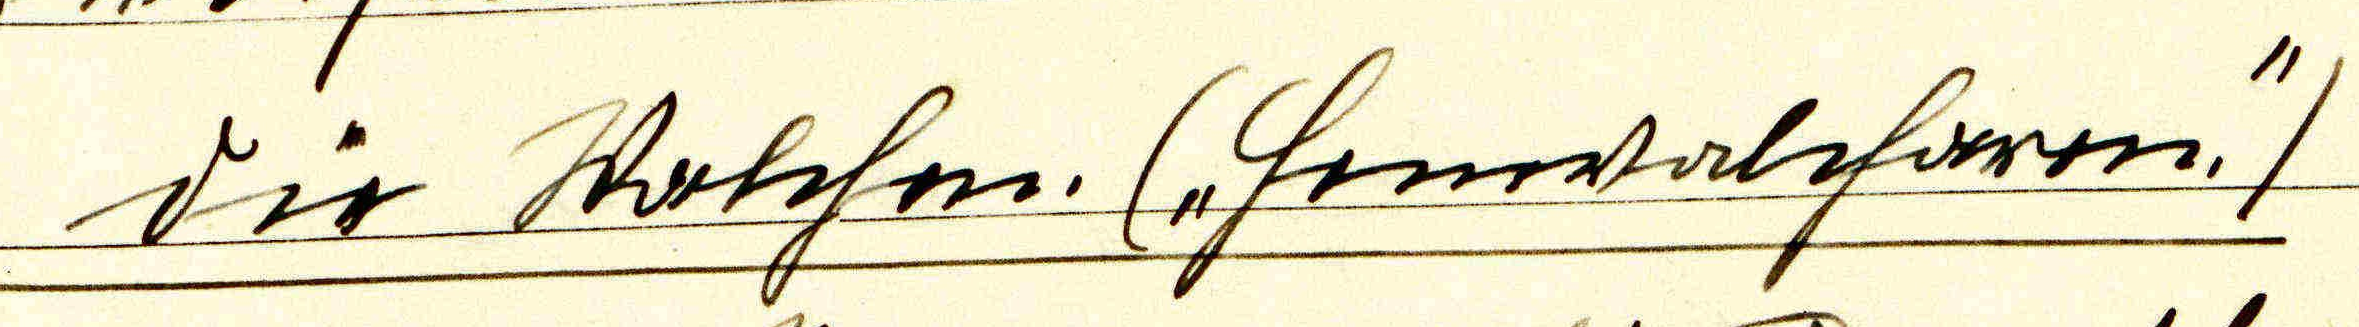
Die Walchen. („Henwalcharen“)
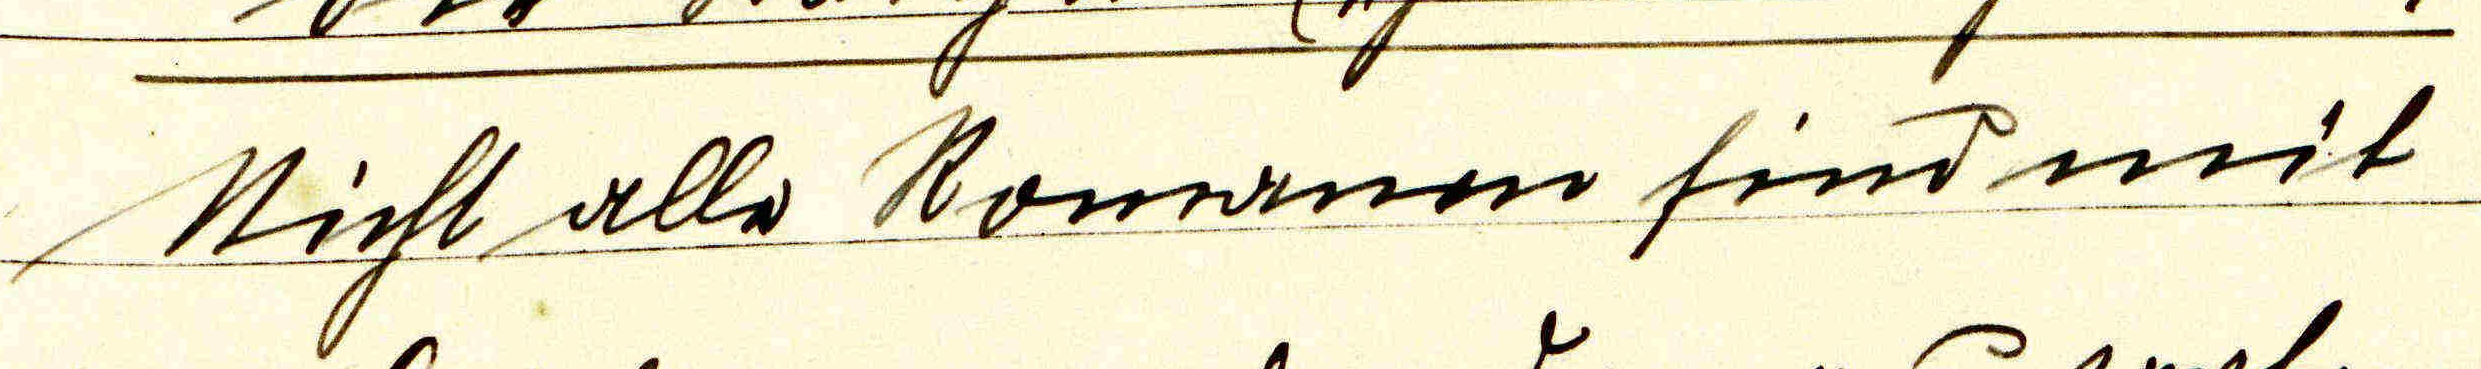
Nicht alle Romanen sind mit
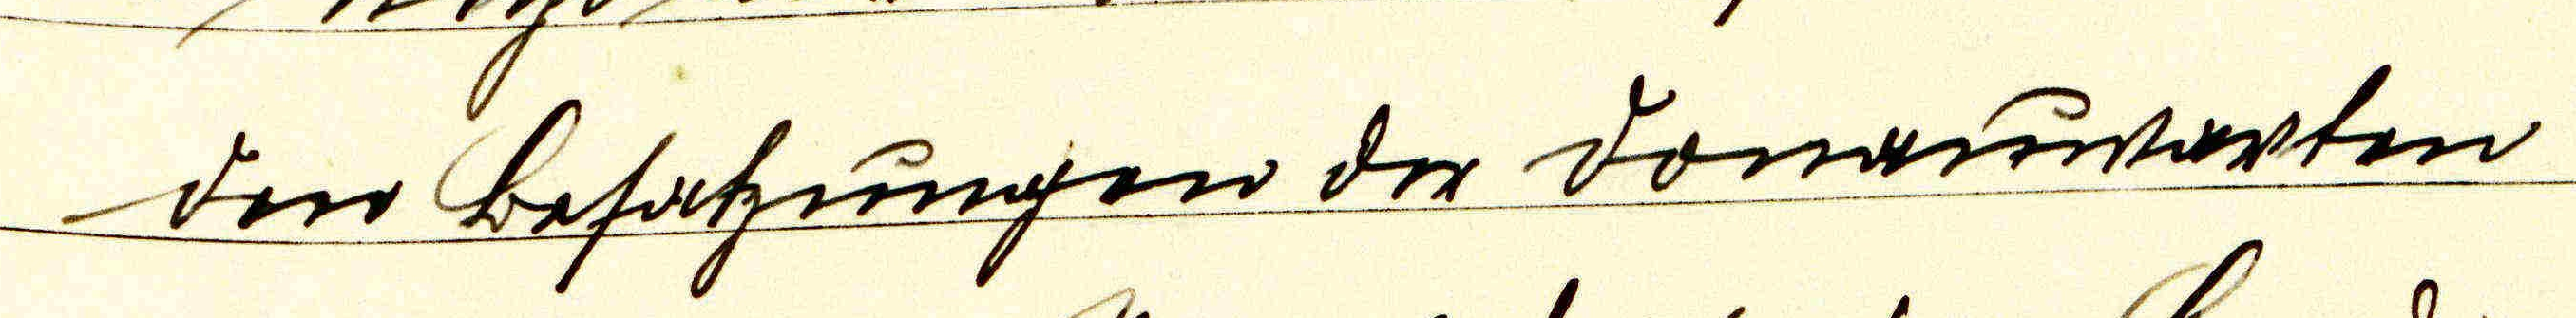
den Besatzungen der Donauwarten
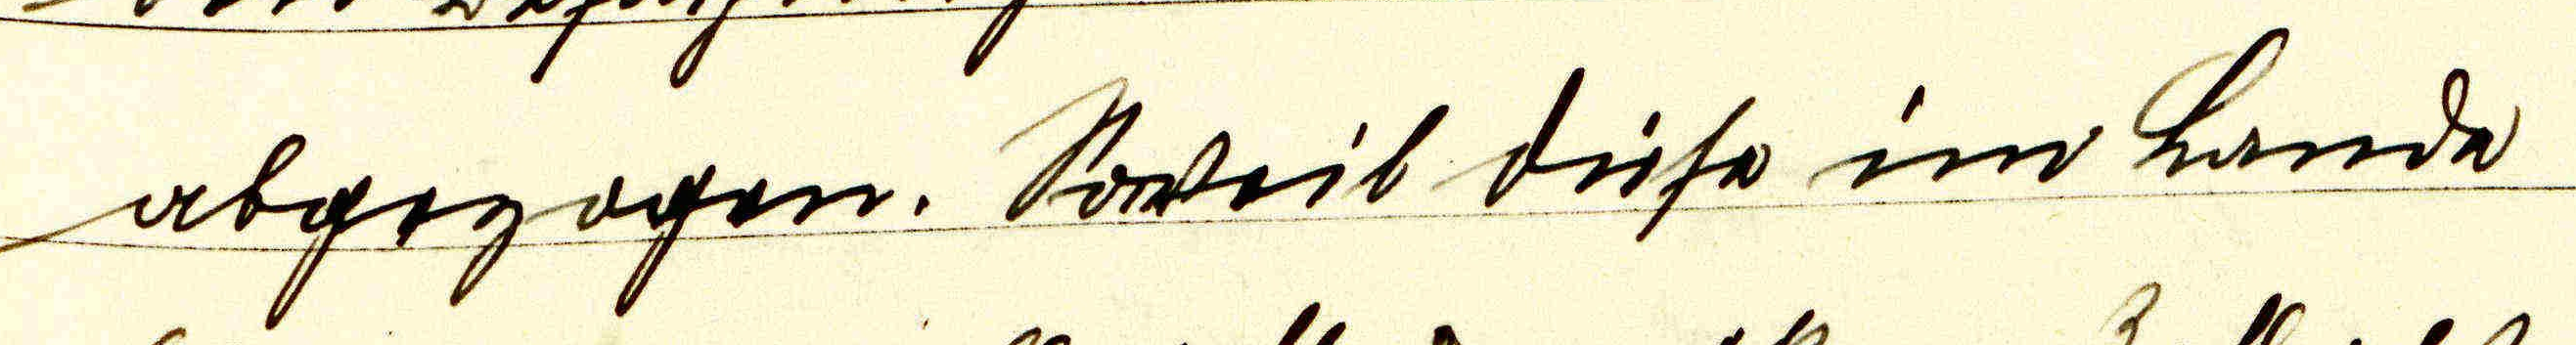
abgezogen, Soweit diese im Lande
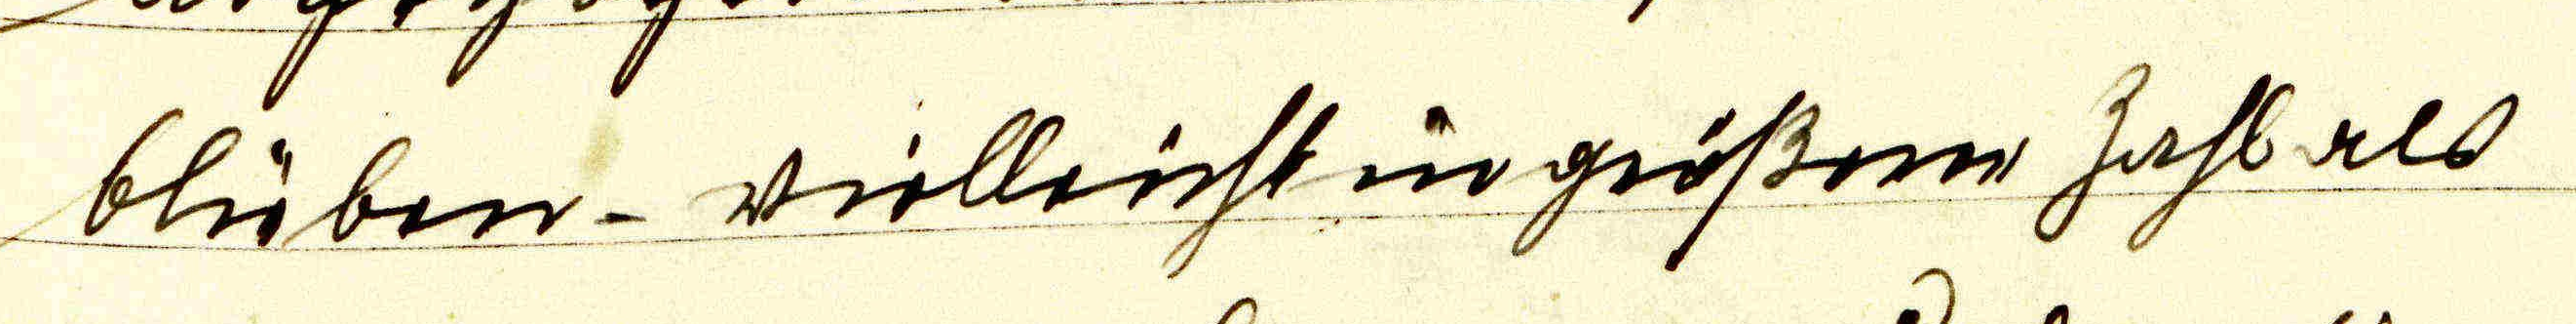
blieben – vielleicht in größerer Zahl als
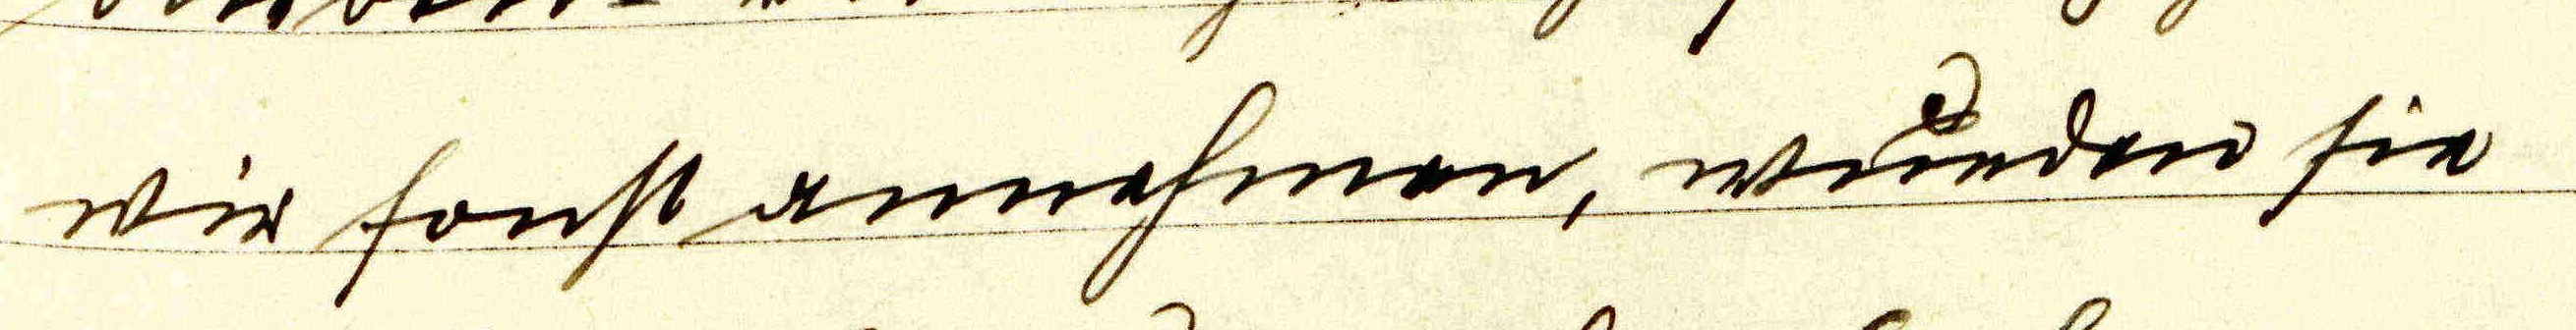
wir sonst annehmen, wurden sie
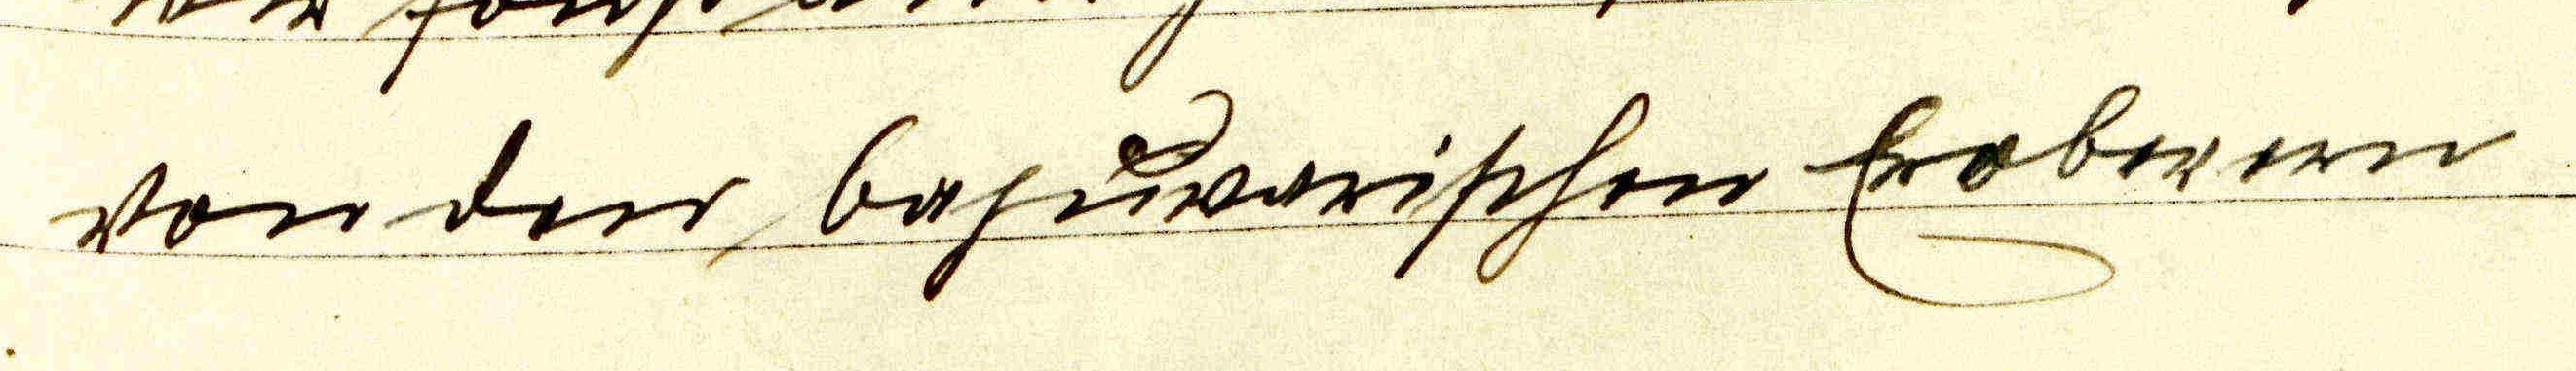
von den bajuwarischen Eroberern
